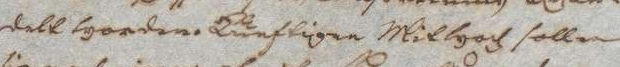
delt worden. Künftigen Mitwoch sollen
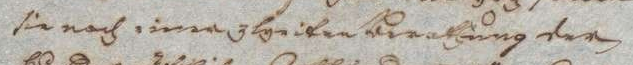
sie noch einer zweiten Berathung der
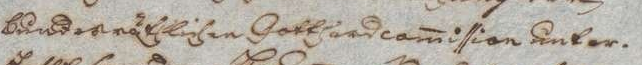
bundesräthlichen Gotthardcommission unter-
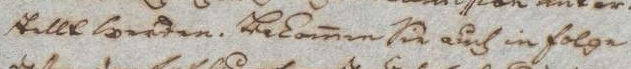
stellt werden. Bekommen Sie auch in Folge
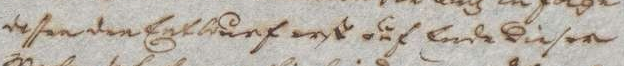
dessen den Entwurf erst auf Ende dieser
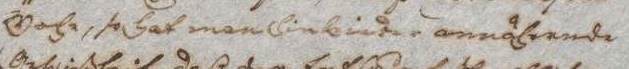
Woche, so hat man hinwieder annähernde
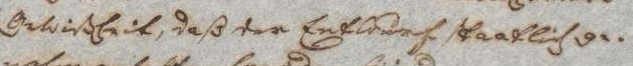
Gewißheit, daß der Entwurf staatlich ge-
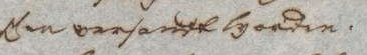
schen versendet worden.
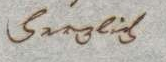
Herzlich
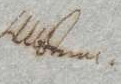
Escher
